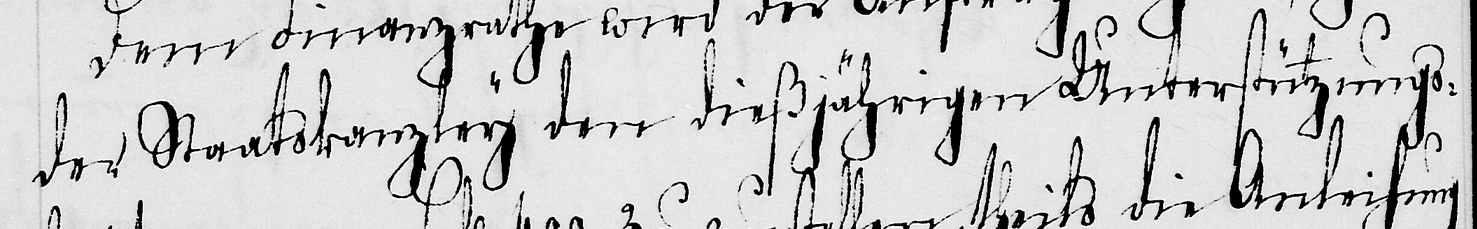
der Staatskanzley den dießjährigen Unterstützungs¬
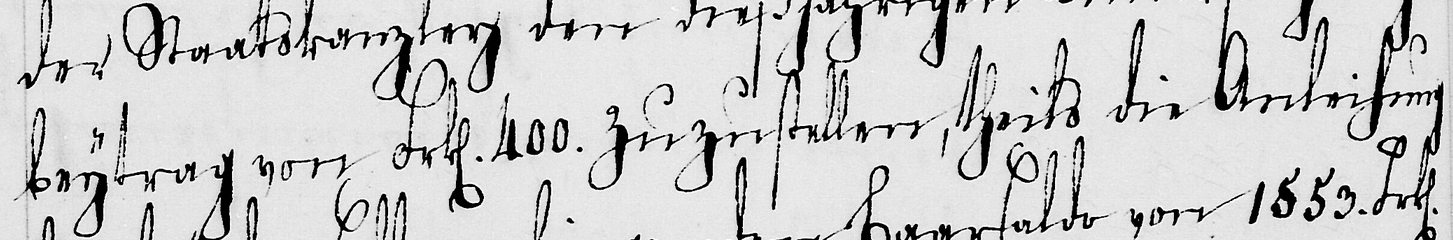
beytrag von Frk[en]. 400. zuzustellen, theils die Anleihung
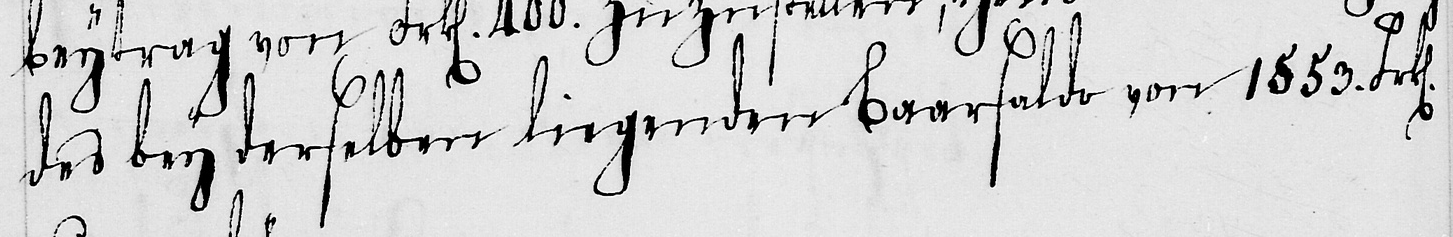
des bey derselben liegenden Baarsaldo von 1553. Fr¬
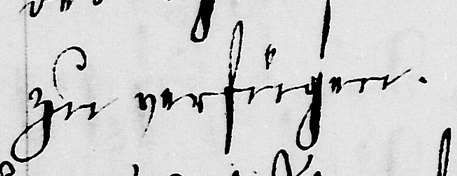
zu verfügen.
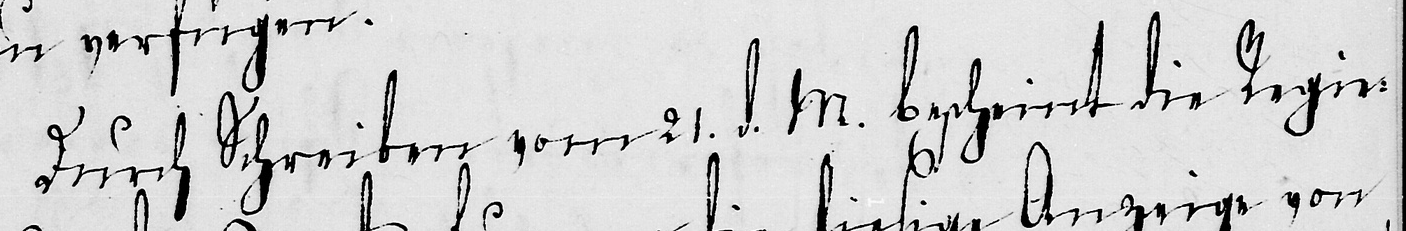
Durch Schreiben vom 21. d. M. bescheint die Regie¬
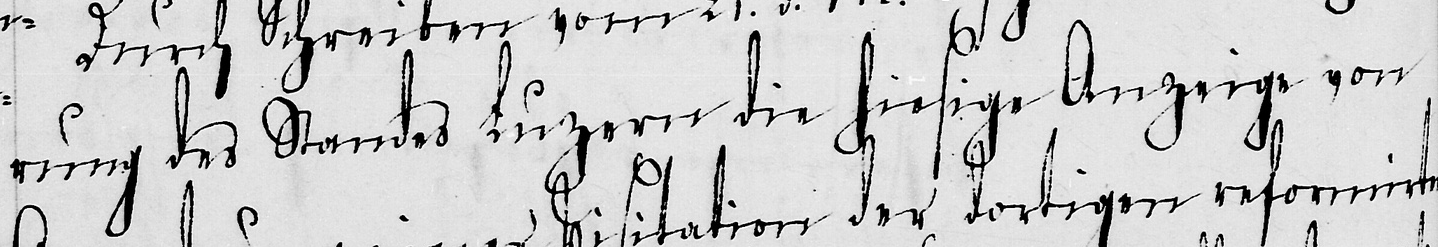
rung des Standes Luzern die hiesige Anzeige von
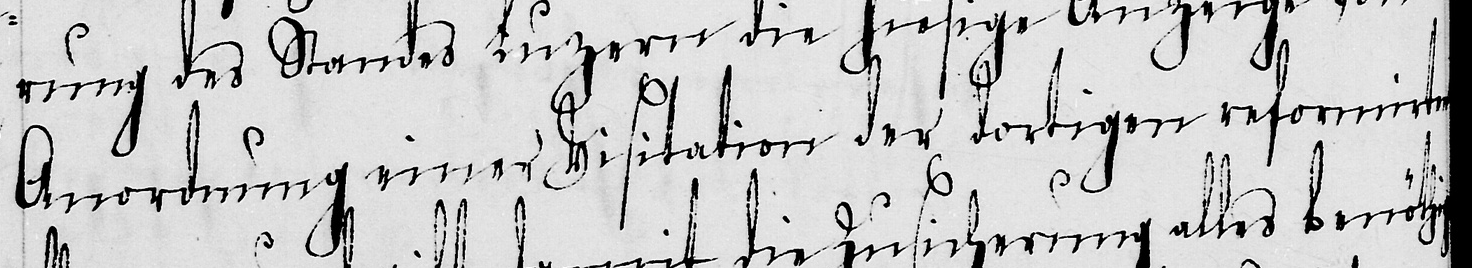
Anordnung einer Visitation der dortigen reformirten
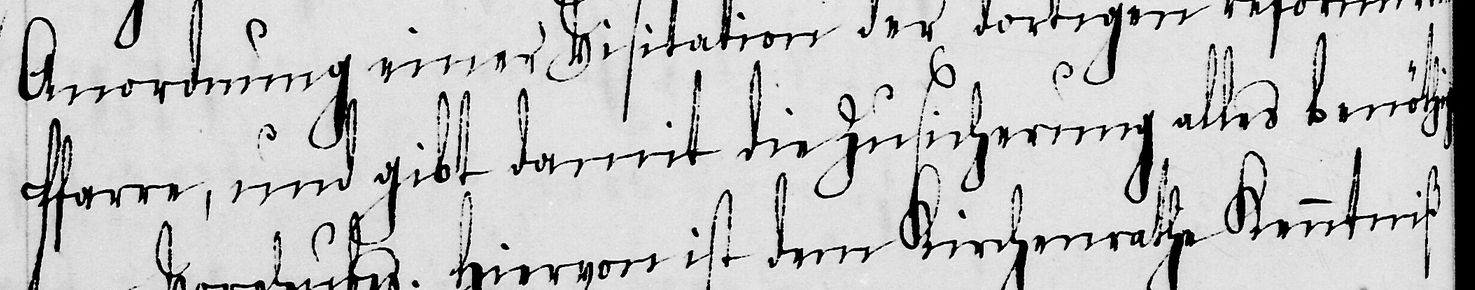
Pfarre, und gibt damit die Zusicherung alles benöt¬
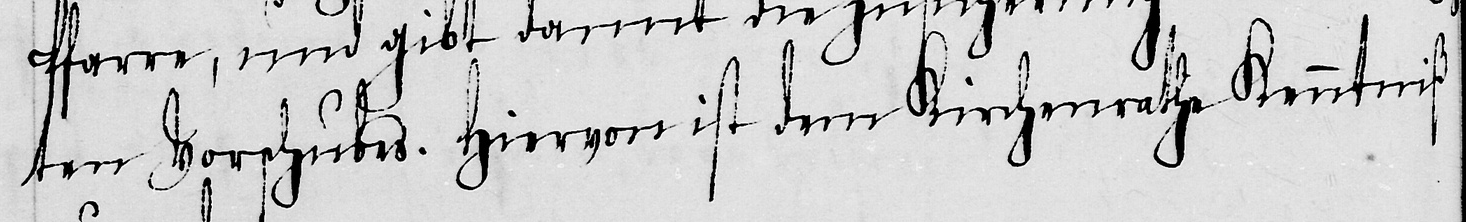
gten Vorschubes. Hiervon ist dem Kirchenrathe Kenntniß
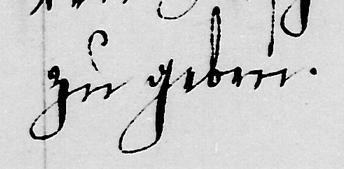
zu geben.
